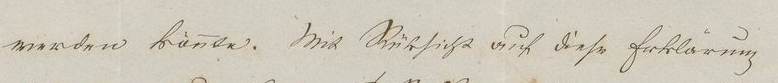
werden könnte. Mit Rüksicht auf diese Erklärung
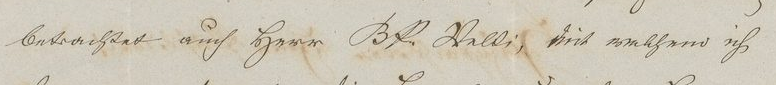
betrachtet auch Herr BR. Welti, dmit welchem ich
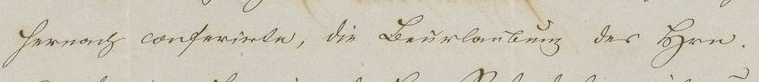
hernach conferirte, die Beurlaubung des Hrn.
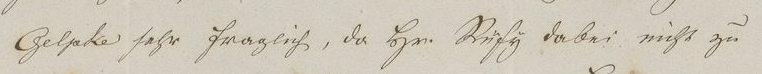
Gelpke sehr fraglich, da Hr. Rüfy dabei nicht zu
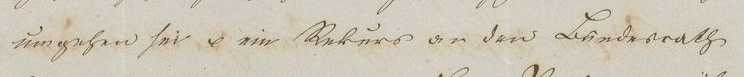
umgehen sei & ein Rekurs an den Bundesrath
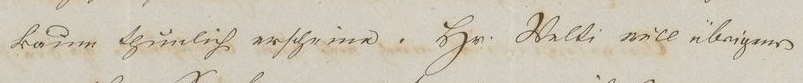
kaum thunlich erscheine. Hr. Welti will übrigens
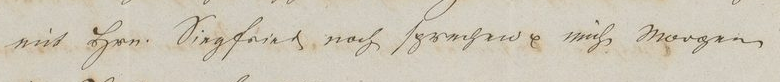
mit Hrn. Siegfried noch sprechen & mich Morgen
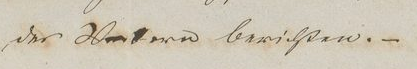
des Weitern berichten. –
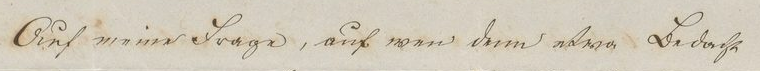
Auf meine Frage auf wen denn etwa Bedacht
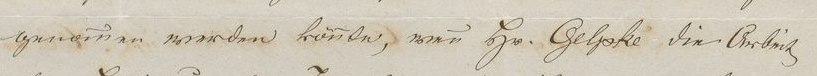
genommen werden könnte, wenn Hr. Gelpke die Arbeit
